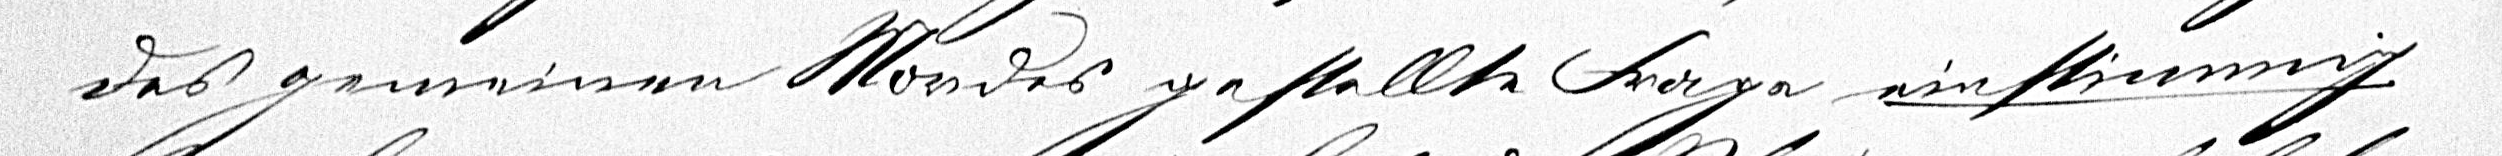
des gemeinen Mordes gestellte Frage einstimmig
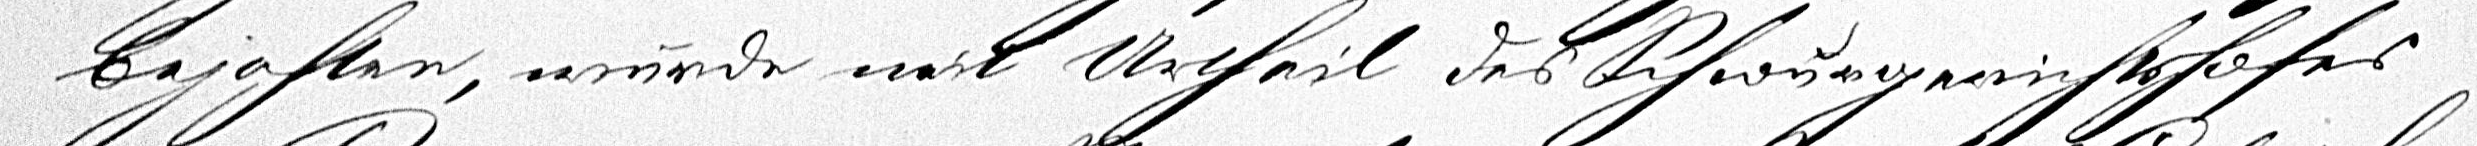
bejahten, wurde mit Urtheil des Schwurgerichtshofes
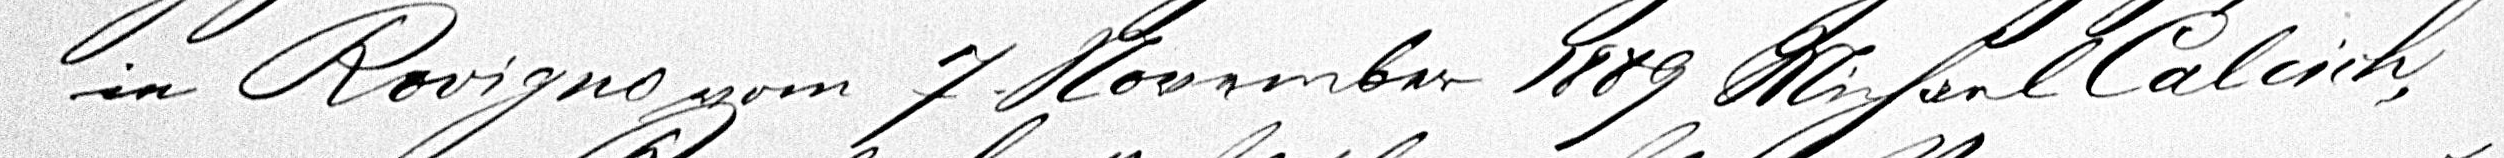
in Rovigno vom 7. November 1889 Michael Calcich,
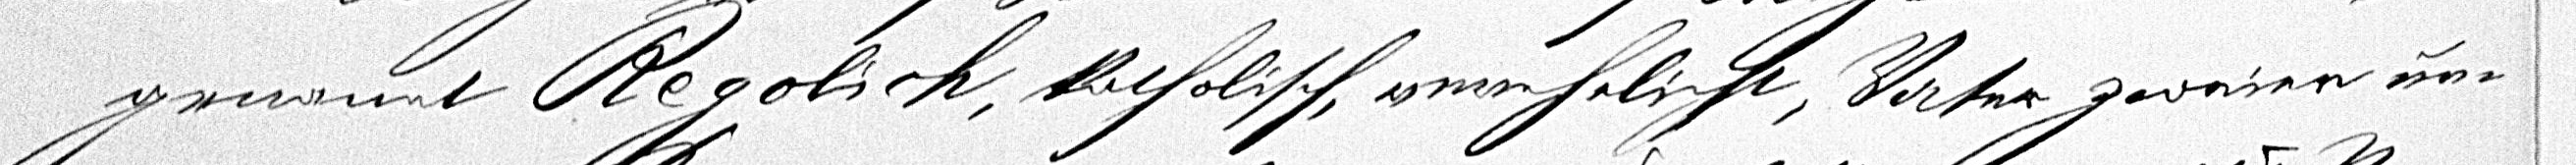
genannt Regolich, katholisch, verehelicht, Vater zweien un¬
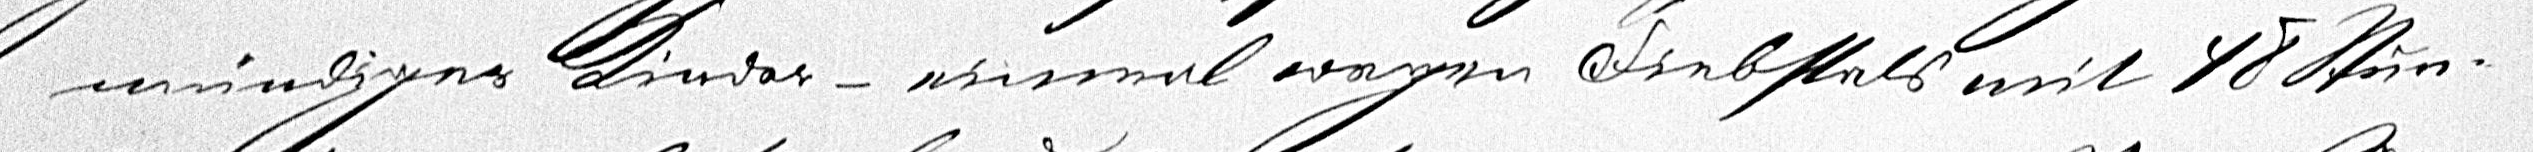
mündiger Kinder - einmal wegen Diebstals mit 48 Stun¬
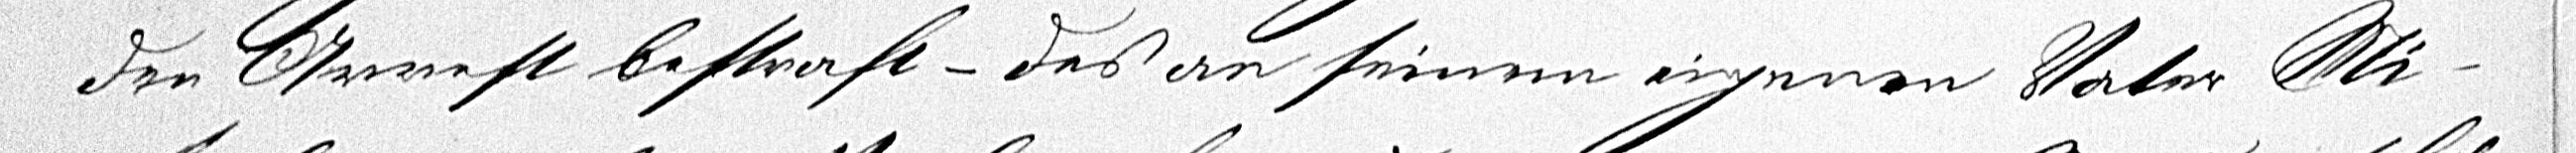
den Arrest bestraft - des an seinem eigenen Vater Mi¬
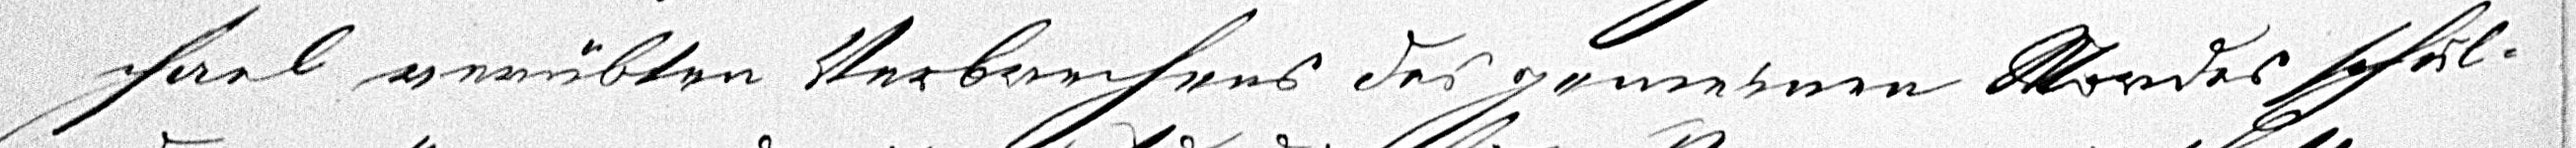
chael verübten Verbrechens des gemeinen Mordes schul¬
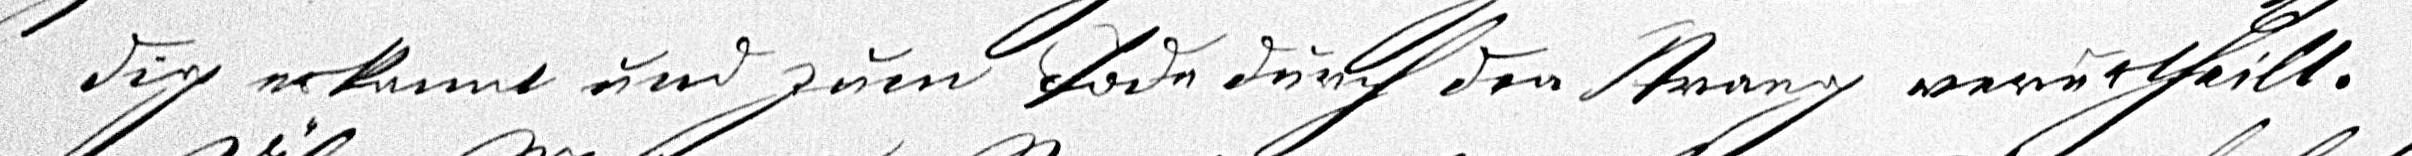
dig erkannt und zum Tode durch den Strang verurtheilt.
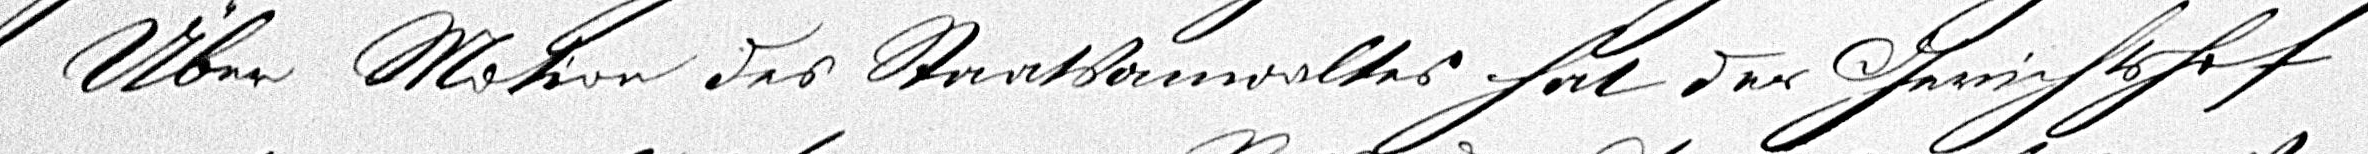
Über Motion des Staatsanwaltes hat der Gerichtshof
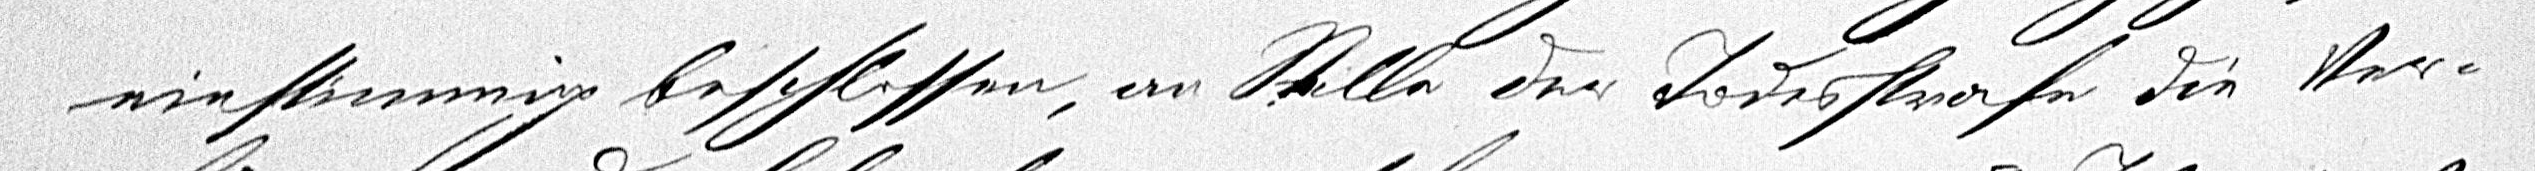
einstimmig beschlossen, an Stille der Todesstrafe die Ver¬
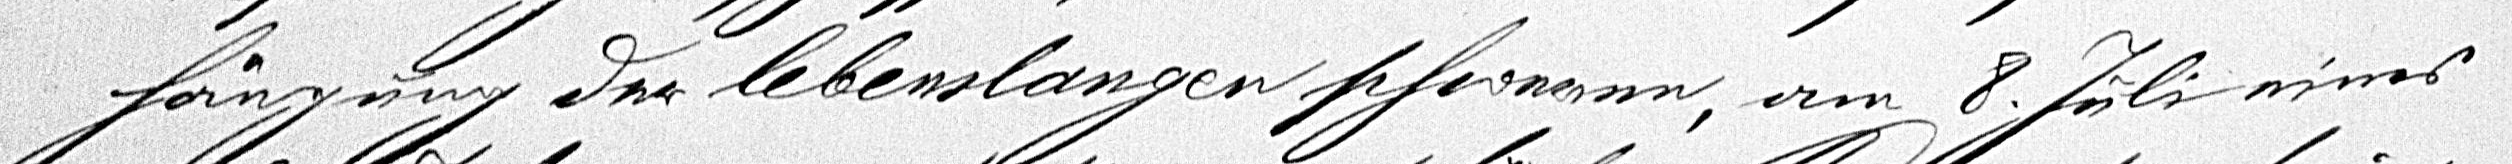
hängung der lebenslangen schweren, am 8. Juli eines
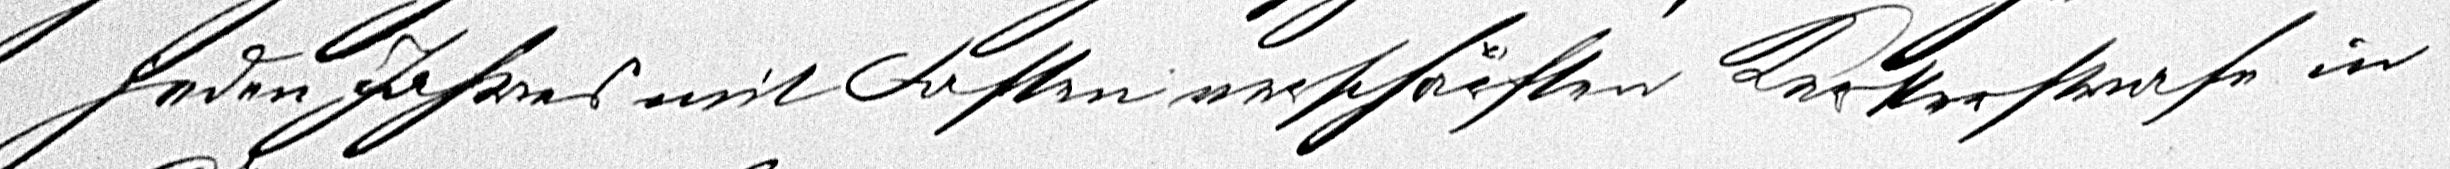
jeden Jahres mit Fasten verschärften Kerkerstrafe in
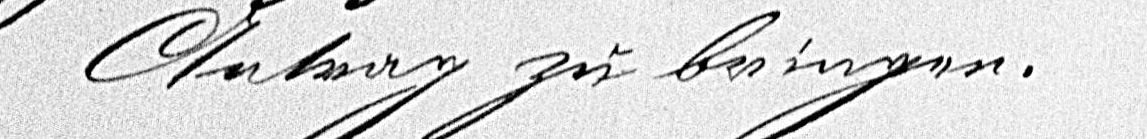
Antrag zu bringen.
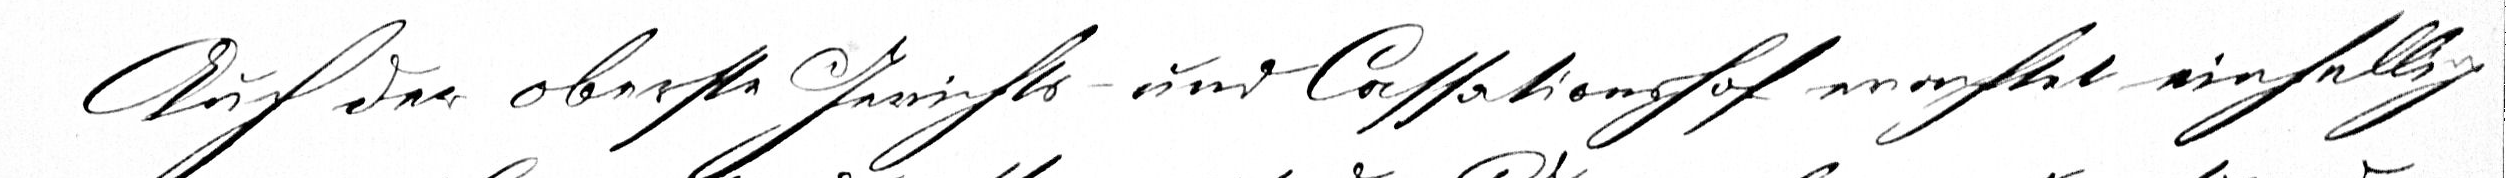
Auch der oberste Gerichts- und Cassationshof erachtet einhellig
